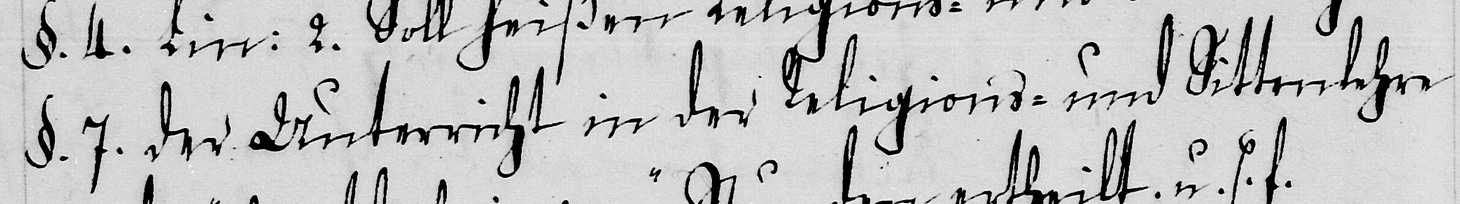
§. 7. der Unterricht in der Religions- und Sittenlehre
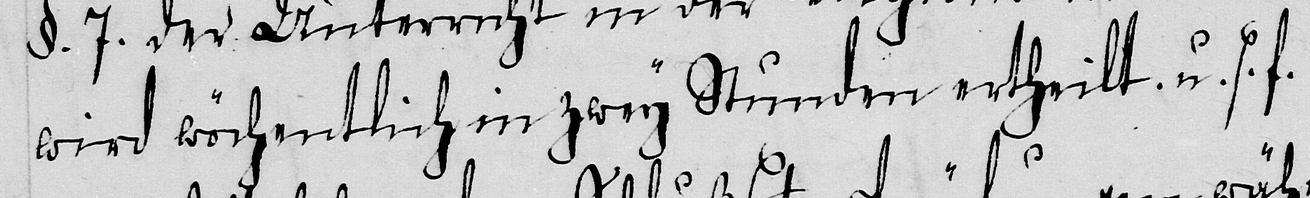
wird wöchentlich in zwey Stunden ertheilt. u. s.
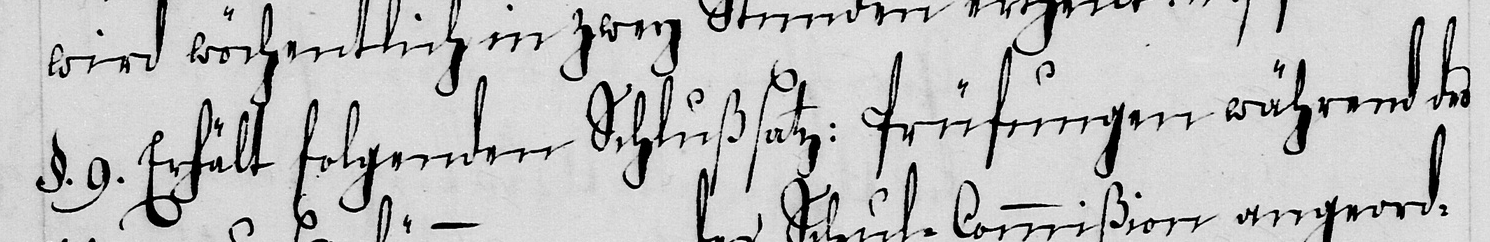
9. Erhält folgenden Schlußsatz: Prüfungen während des
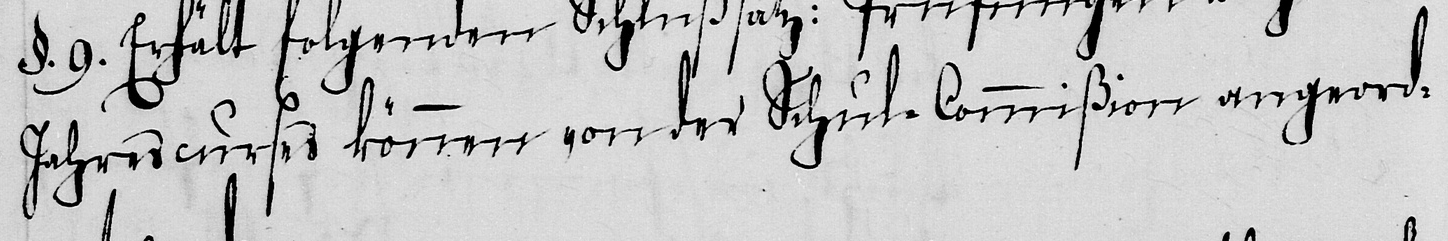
Jahrecurses können von der Schul-Commißion angeord¬
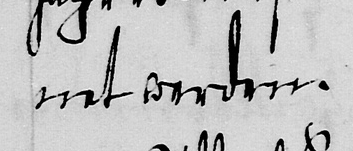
net werden.
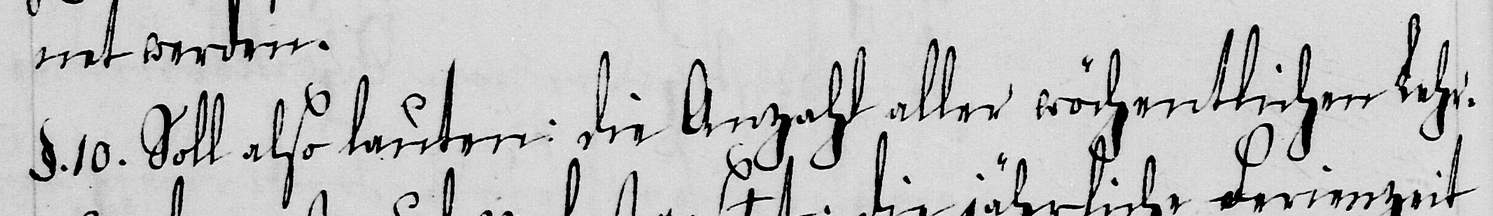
10. Soll also lauten: die Anzahl aller wöchentlichen Lehr¬
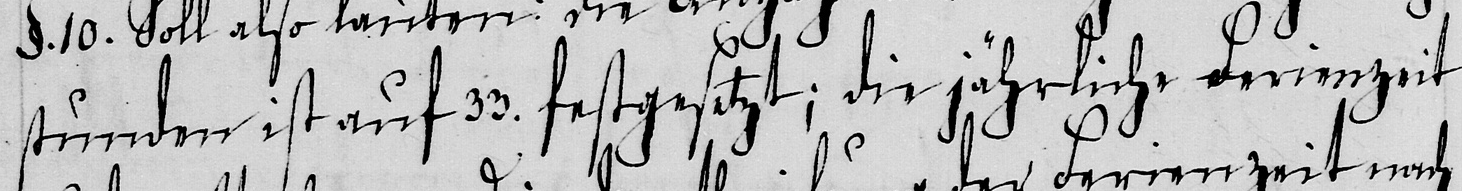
stunden ist auf 33. festgesetzt; die jährliche Ferienzeit
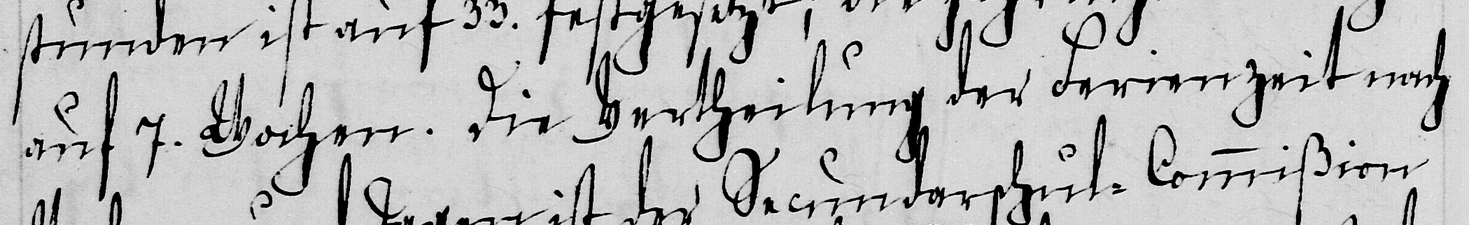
auf 7. Wochen. Die Vertheilung der Ferienzeit nach
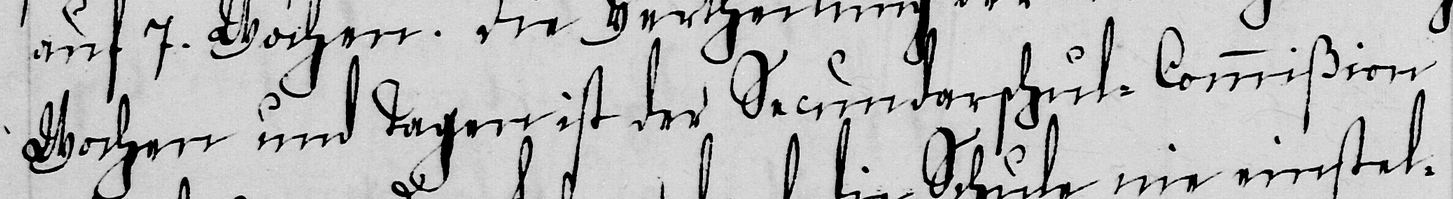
Wochen und Tagen ist der Secundarschul-Commißion
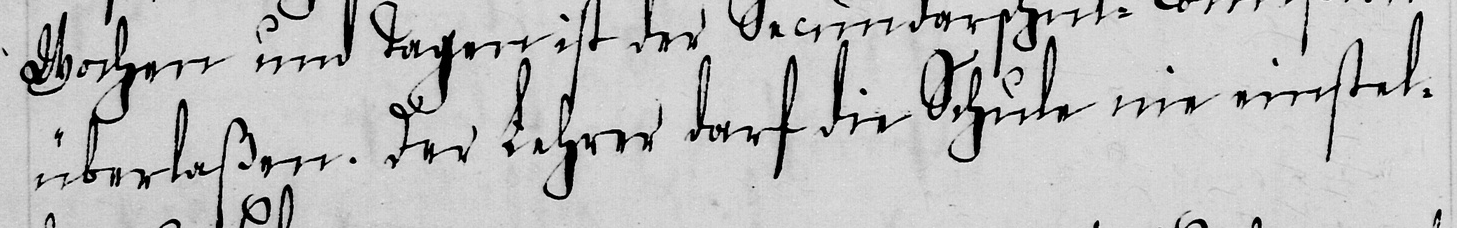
überlaßen. Der Lehrer darf die Schule nie einstel¬
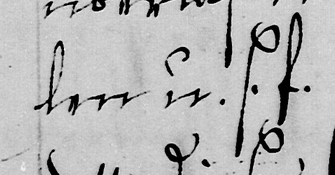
len u. s.
